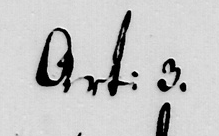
Art: 3.
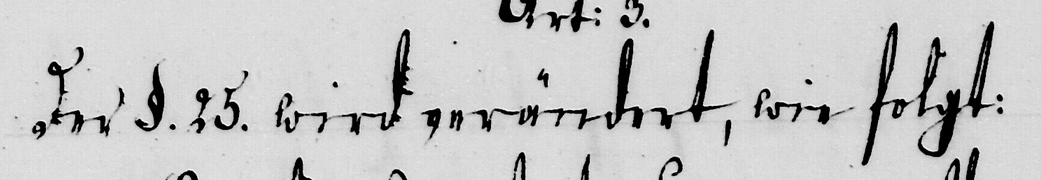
Der §. 25. wird verändert, wie folgt:
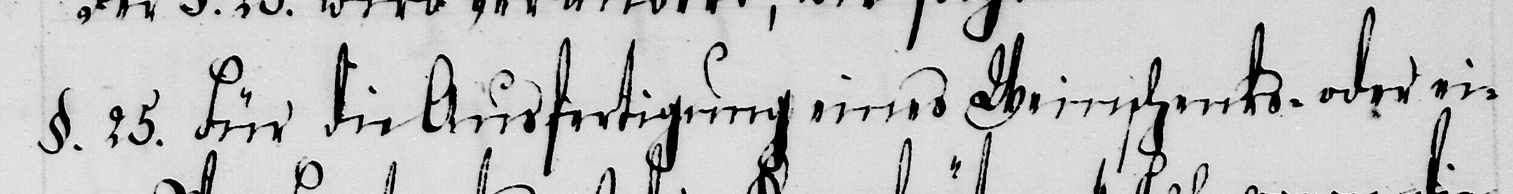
§. 25. Für die Ausfertigung eines Weinschenks- oder ei¬
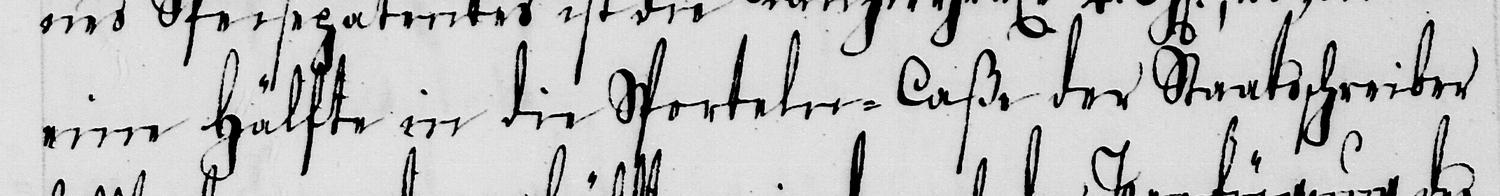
eine Hälfte in die Sporteln-Caße der Staatsschreiber
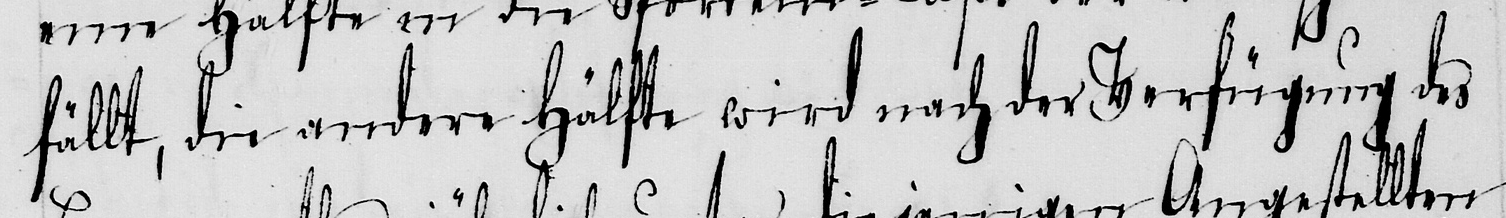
fällt, die andere Hälfte wird nach der Verfügung des
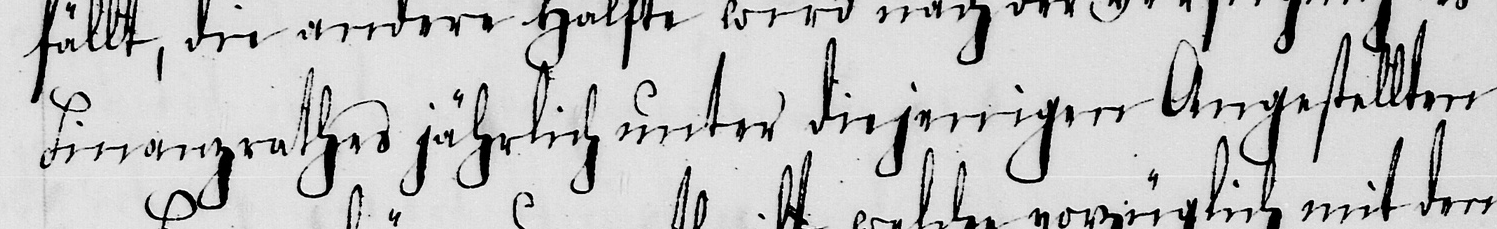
Finanzrathes jährlich unter diejenige Angestellten
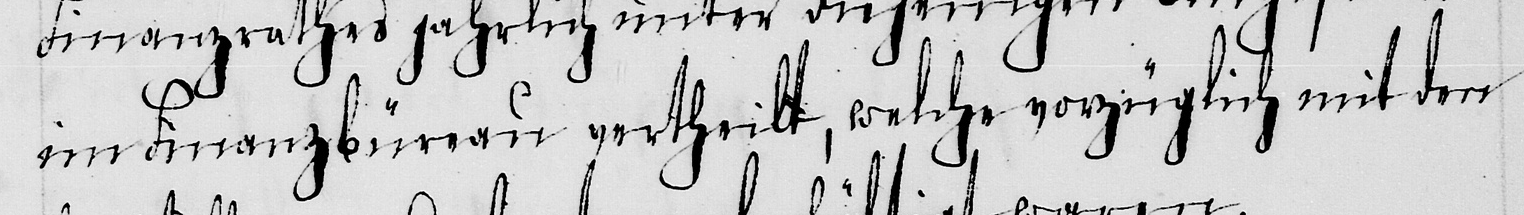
im Finanzbüreau vertheilt, welche vorzüglich mit den
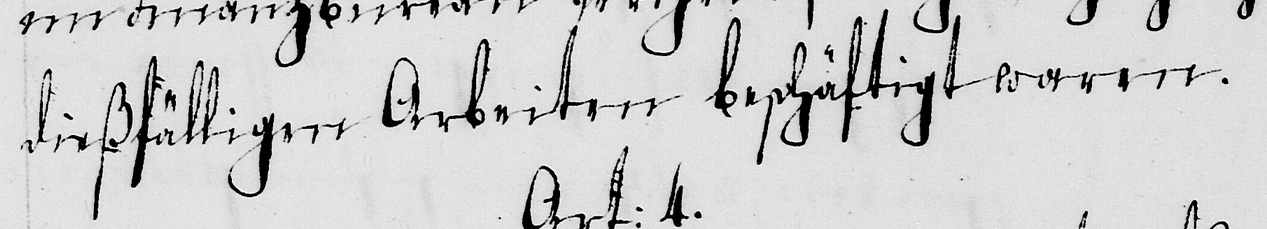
dießfälligen Arbeiten beschäftigt waren.
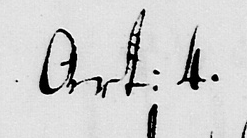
Art: 4.
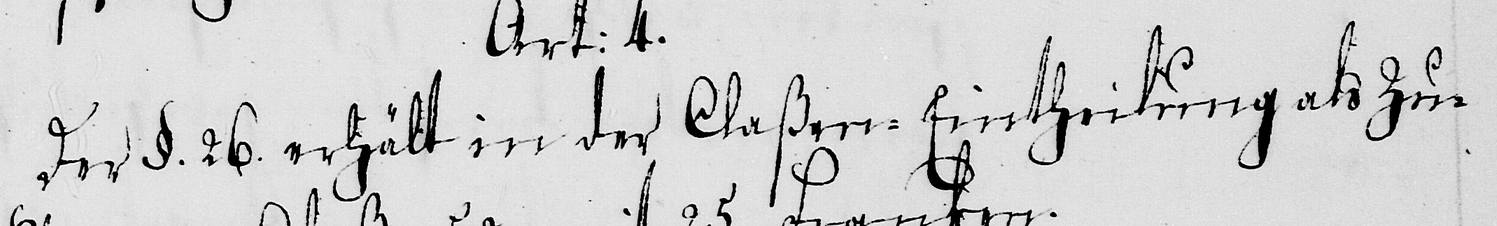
Der §. 26. erhält in der Claßen-Eintheilung als Zu¬
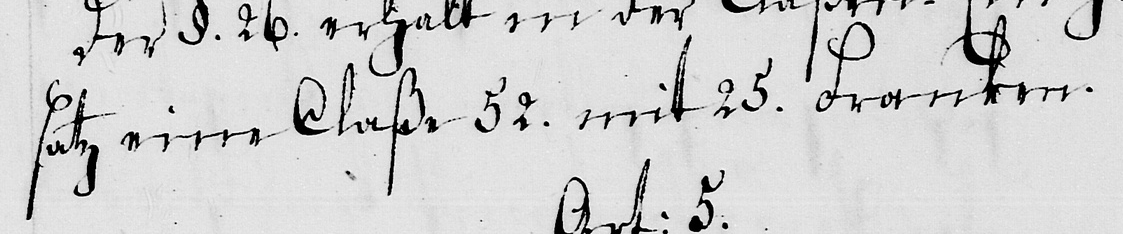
satz eine Claße 52. mit 25. Franken.
